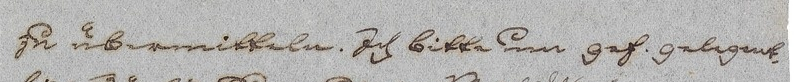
zu übermitteln. Ich bitte um gef. gelegent-
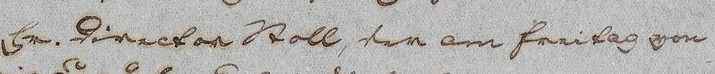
Hr. Director Stoll, der am Freitag von
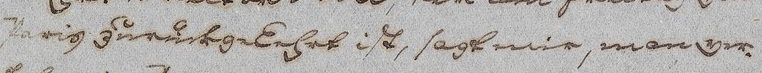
Paris zurückgekehrt ist, sagt mir, man ver-
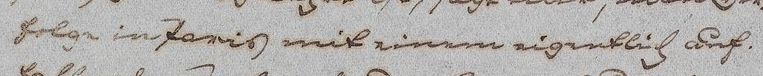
folge in Paris mit einem eigentlich auf-
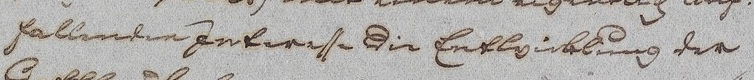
fallenden Interesse die Entwicklung der
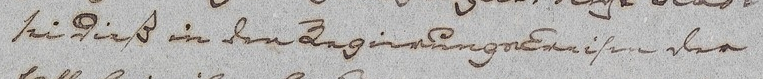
sei dieß in den Regierungskreisen der
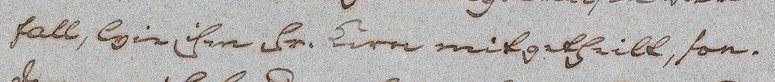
Fall, wie ihm Hr. Kern mitgetheilt, son-
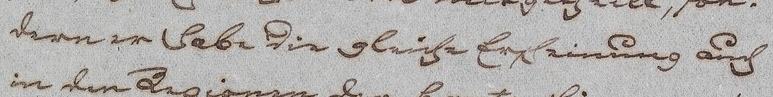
dern er habe die gleiche Erscheinung auch
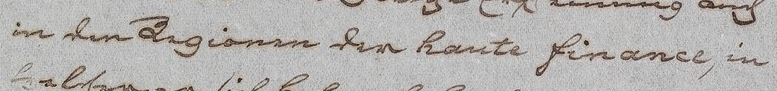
in den Regionen der haute finance, in
